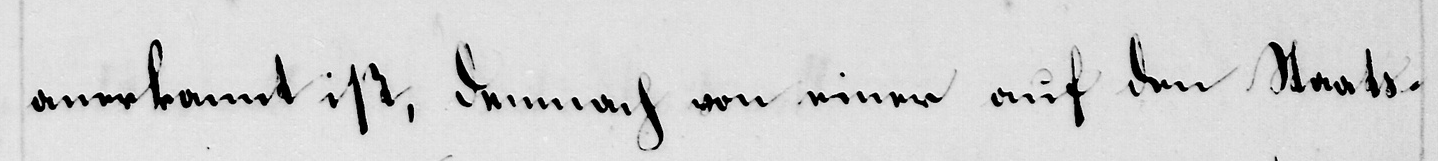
anerkannt ist, demnach von einer auf den Staats¬
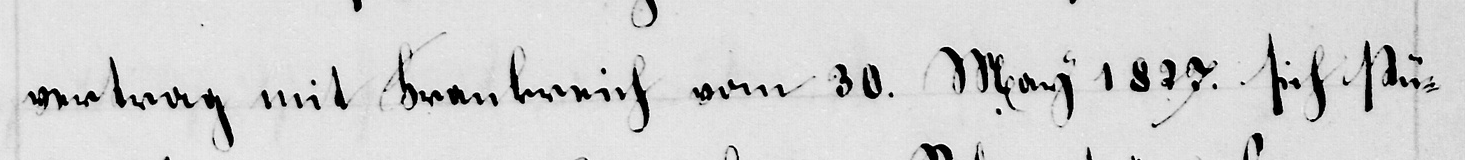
vertrag mit Frankreich vom 30. May 1827. sich stü¬
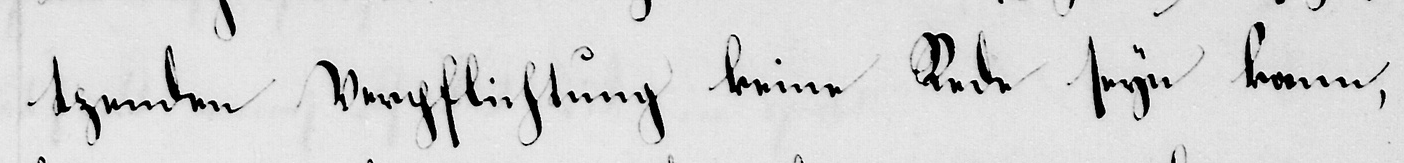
tzenden Verpflichtung keine Rede seyn kann,
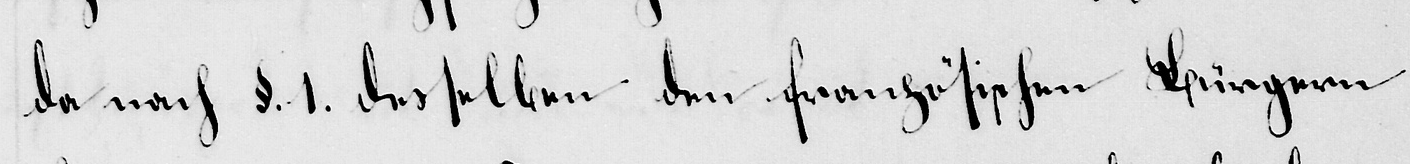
da nach §. 1. desselben den französischen Bürgern
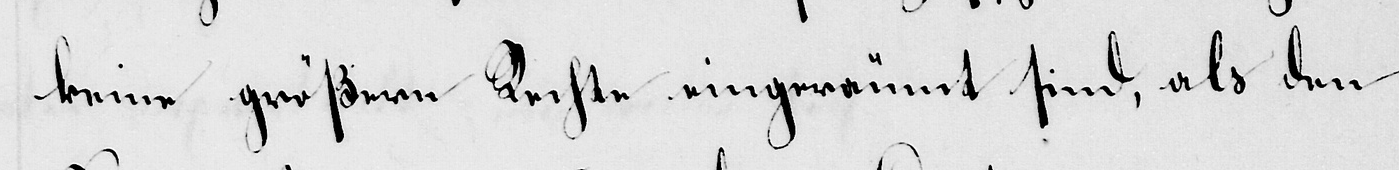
keine größern Rechte eingeräumt sind, als den
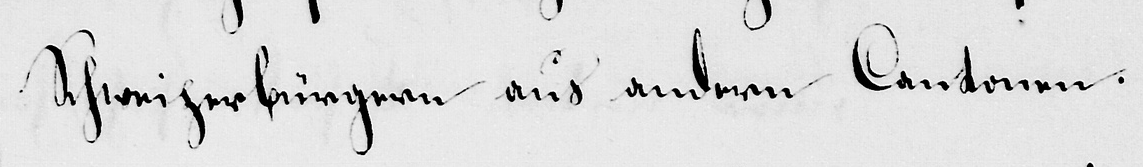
Schweizerbürgern aus andern Cantonen.
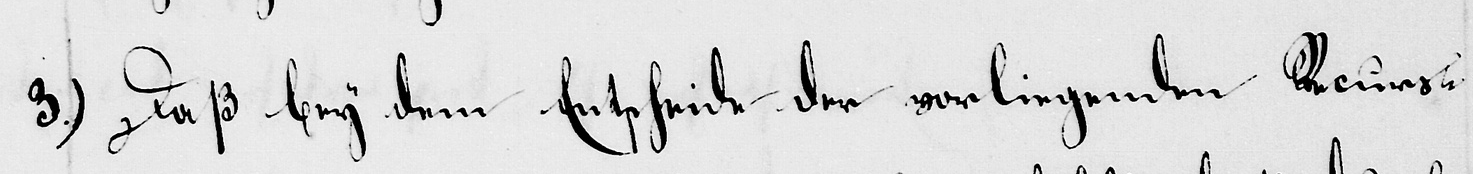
3.) Daß bey dem Entscheide der vorliegenden Recurs¬
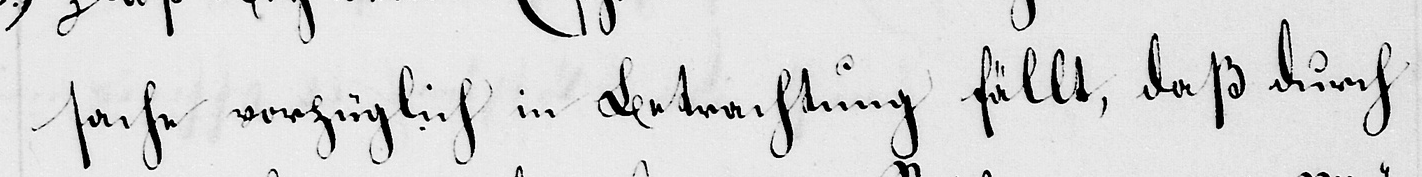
sache vorzüglich in Betrachtung fällt, daß durch
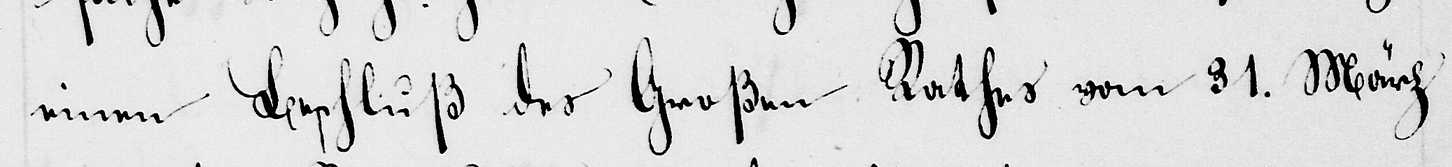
einen Beschluß des Großen Rathes vom 31. März
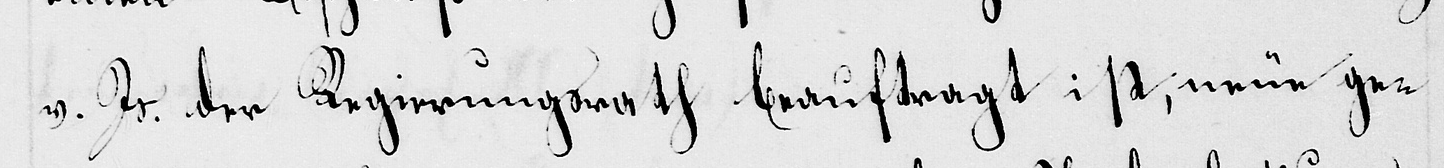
v. Js. der Regierungsrath beauftragt ist, neue ge¬
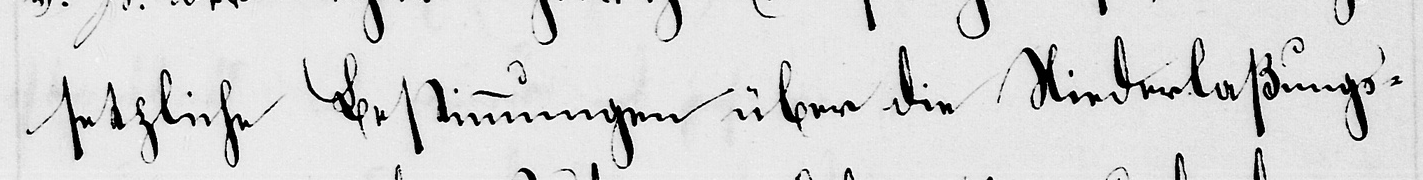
setzliche Bestimmungen über die Niederlaßungs¬
